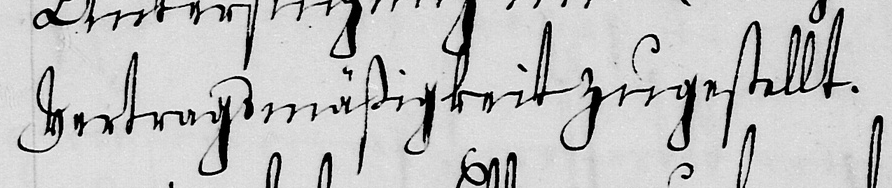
Vertragsmäßigkeit zugestellt.
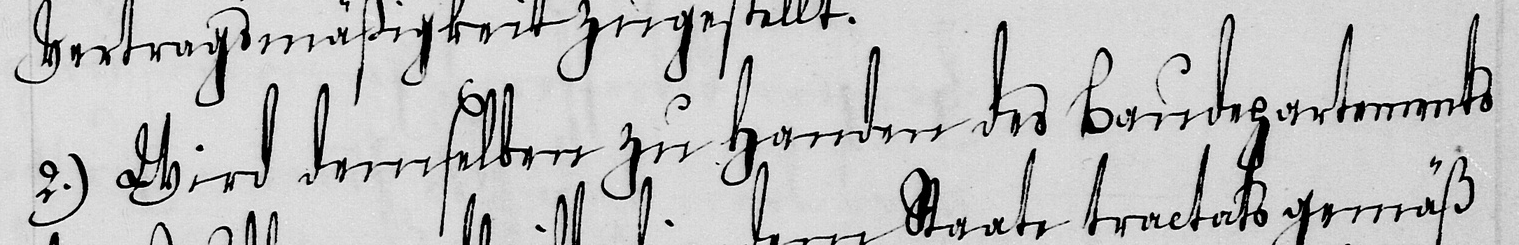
2.) Wird demselben zu Handen des Baudepartements
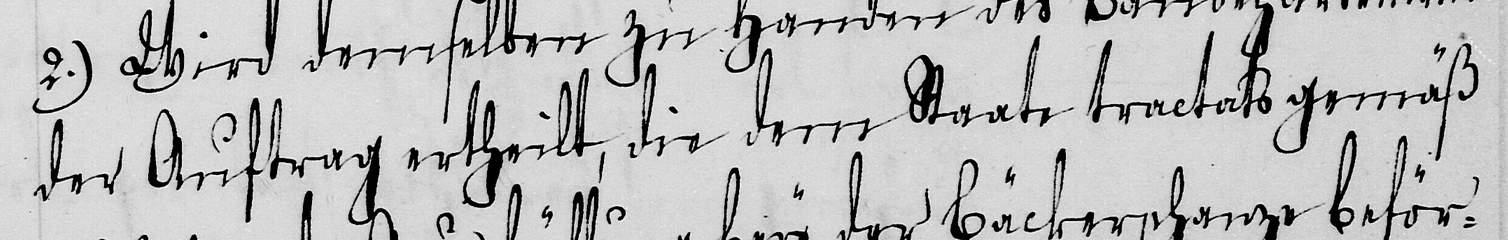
der Auftrag ertheilt, die dem Staate tractatsgemäß
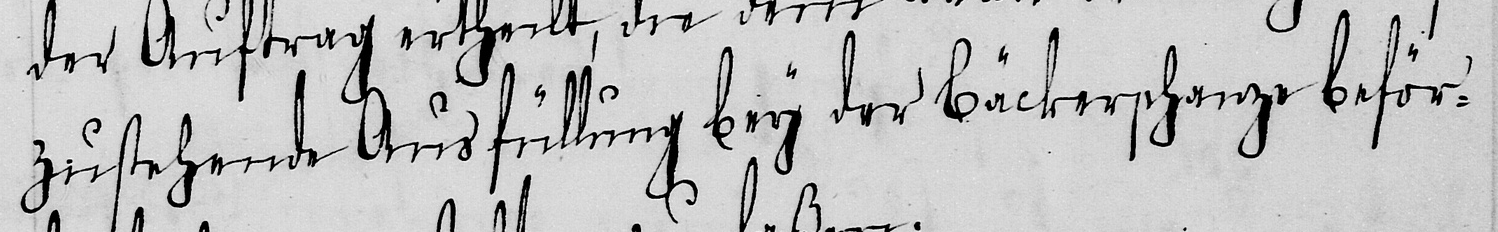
zustehende Ausfüllung bey der Bäckerschanze beför¬
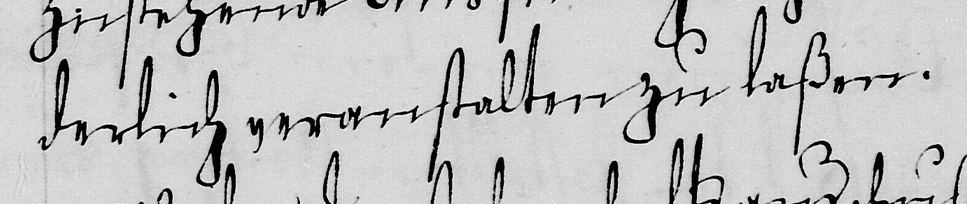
derlich veranstalten zu laßen.
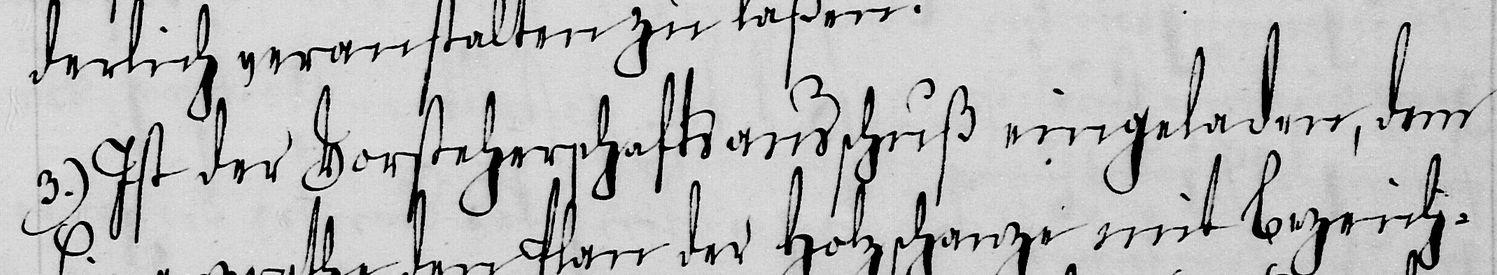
3.) Ist der Vorsteherschaftsausschuß eingeladen, dem
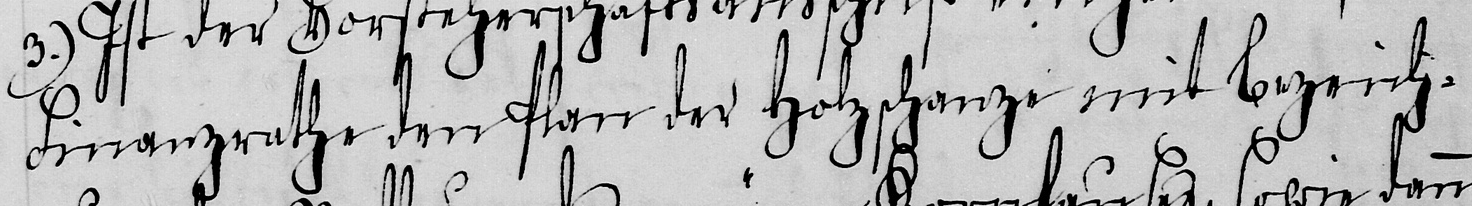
Finanzrathe den Plan der Holzschanze mit Bezeich¬
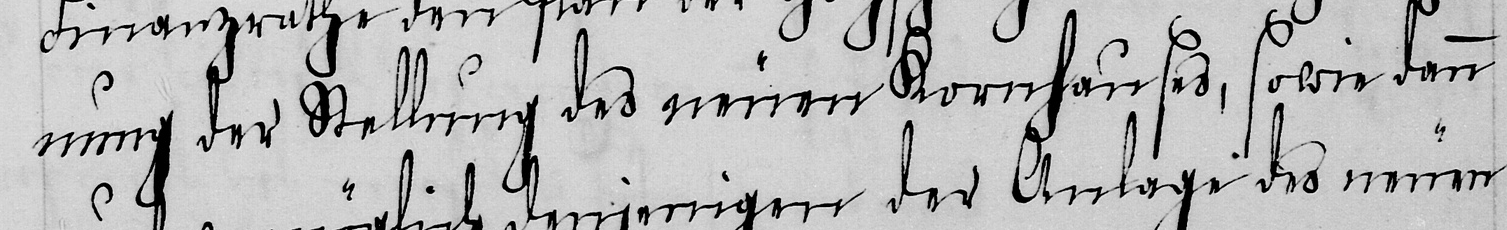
nung der Stellung des neuen Kornhauses, sowie dann
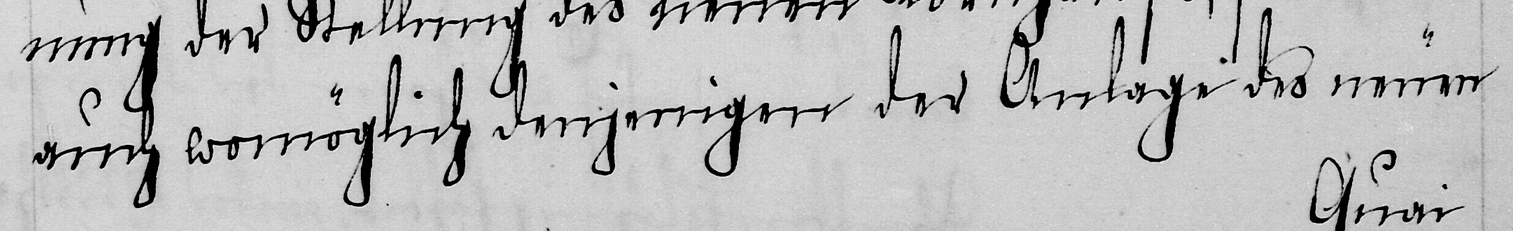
auch womöglich denjenigen der Anlage des neuen
